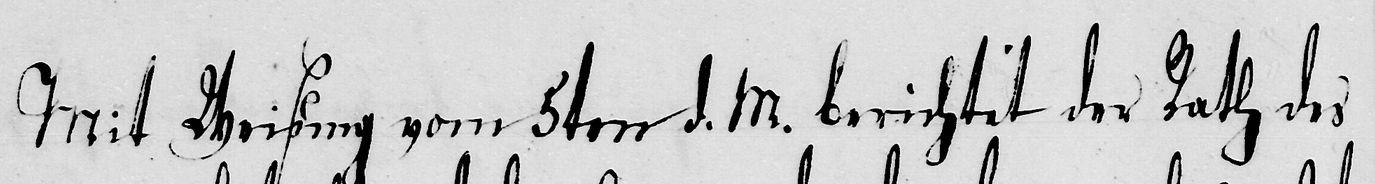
Mit Weisung vom 5ten d. M. berichtet der Rath des
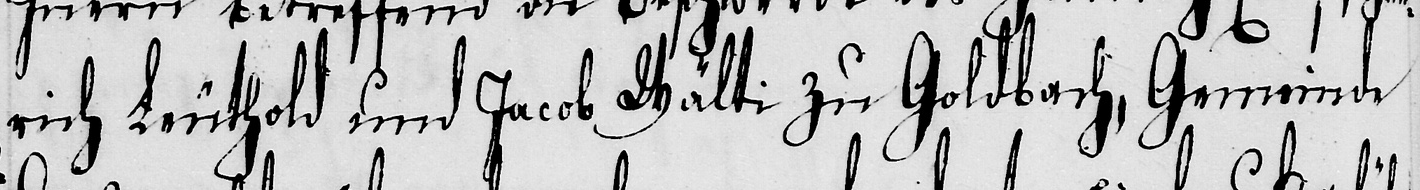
ich Leuthold und Jacob Wälti zu Goldbach, Gemeinde
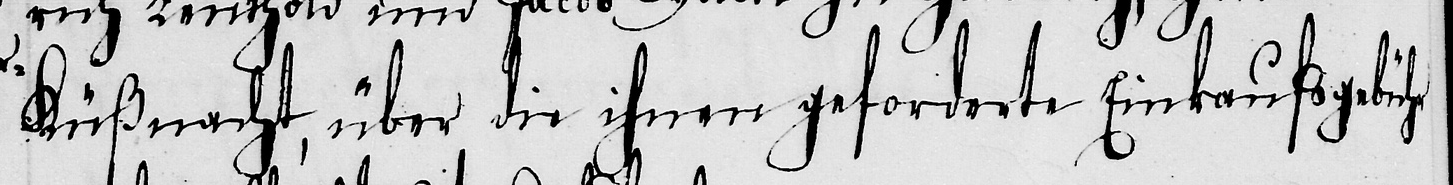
Küßnacht, über die ihnen geforderte Einkaufsgebühr
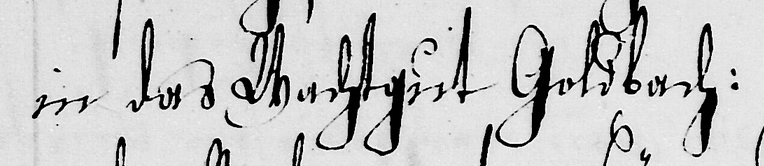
in das Wachtgut Goldbach:
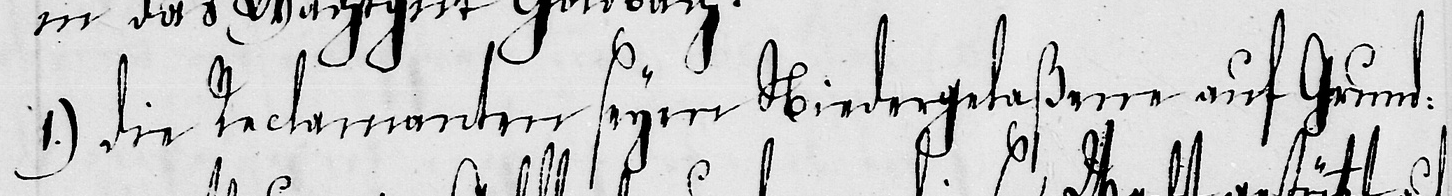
1.) die Reclamanten seyen Niedergelaßene auf Grun¬
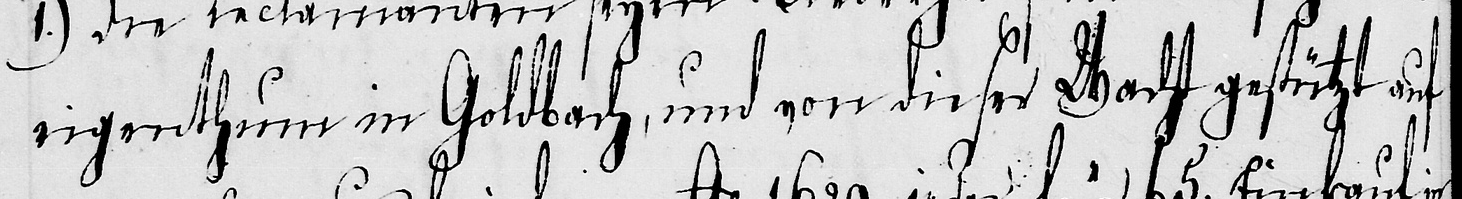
deigenthum in Goldbach, und von dieser Wacht gestützt
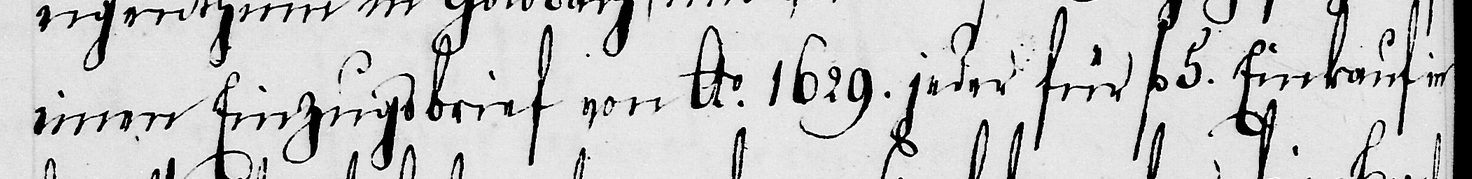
einen Einzugsbrief von A°. 1629. jeder für fl. 5. Einkauf in
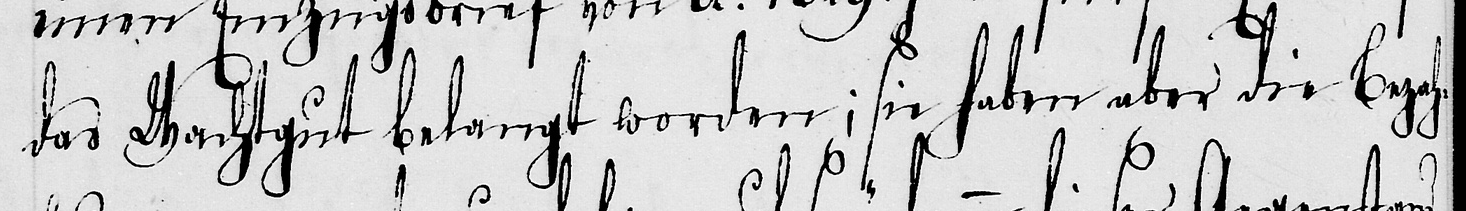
das Wachtgut belangt worden; sie haben aber die Beza¬
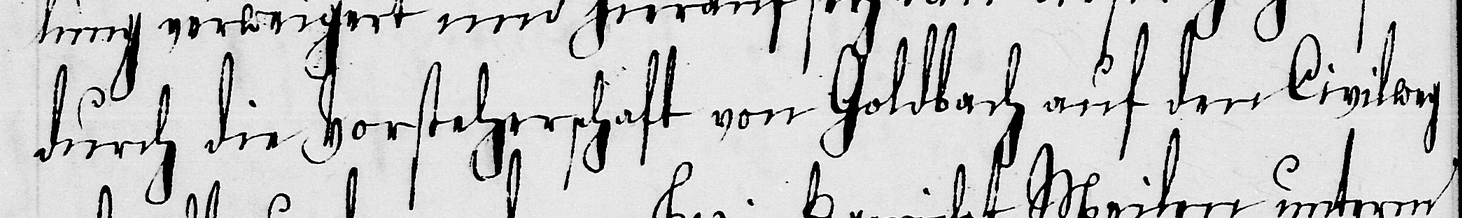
durch die Vorsteherschaft von Goldbach auf den Civilw¬
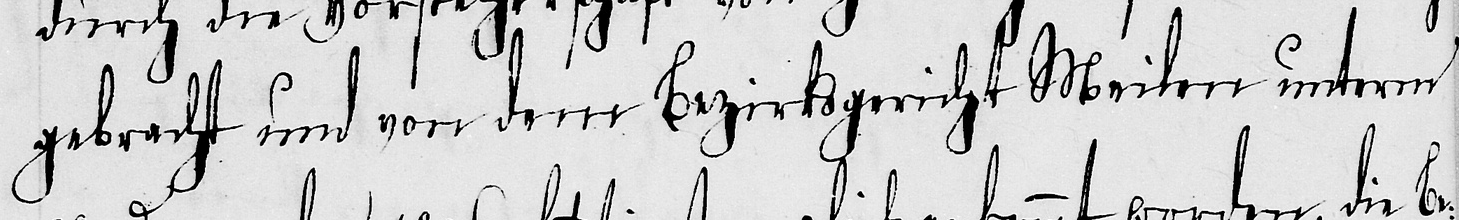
gebracht und von dem Bezirksgericht Meilen unterm
